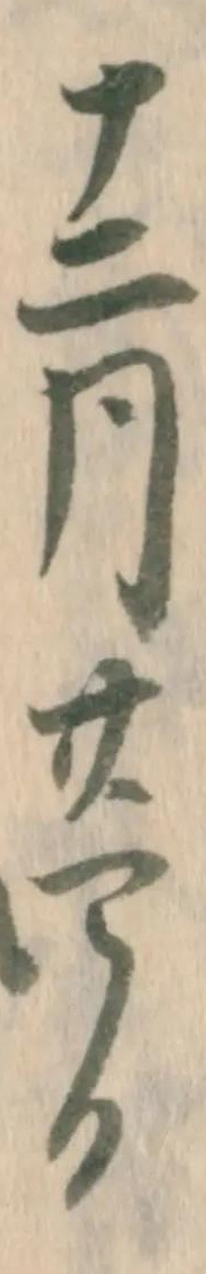十二月廿四日
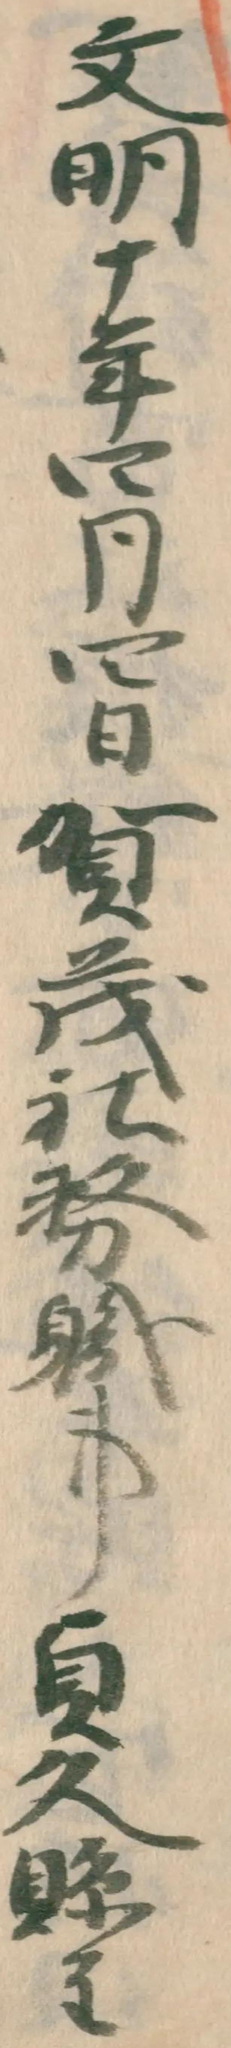文明十年四月四日賀茂社務職事貞久県主
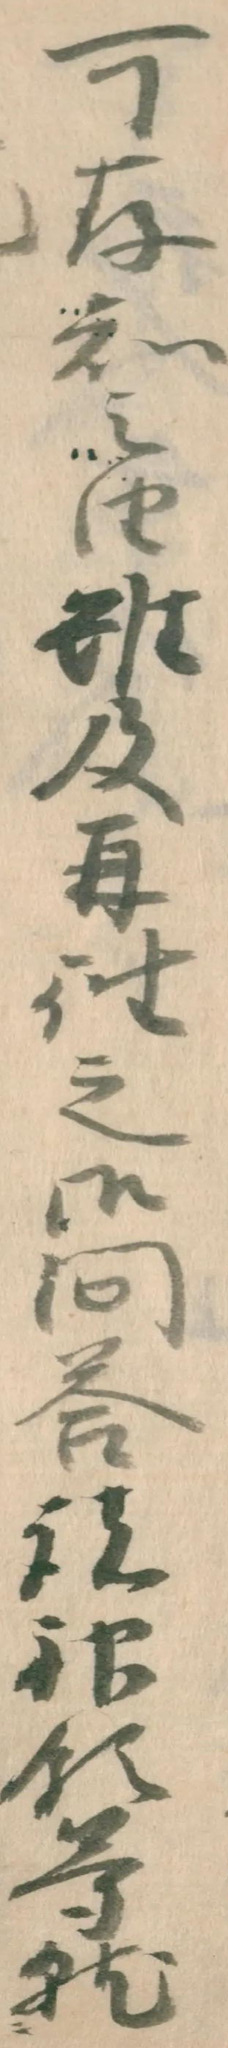可存知之由雖及再往之御問答諸神領等就
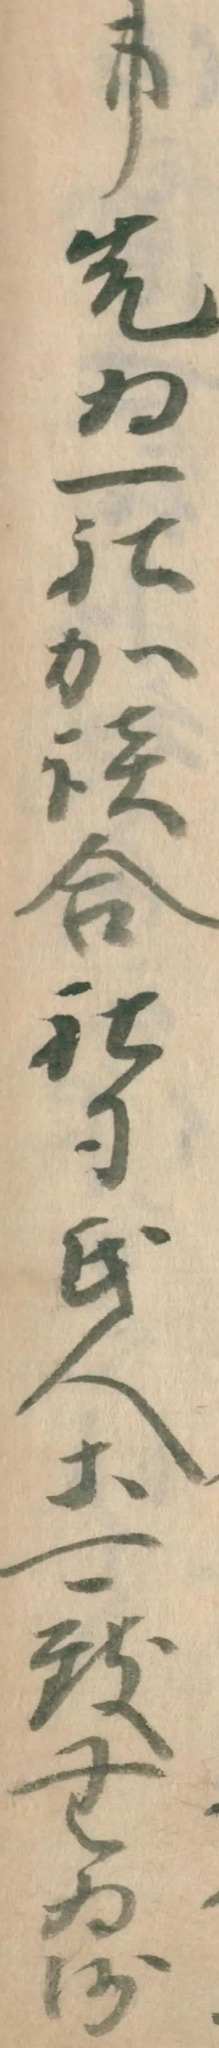事先為一社加談合社司氏人等可致無為沙

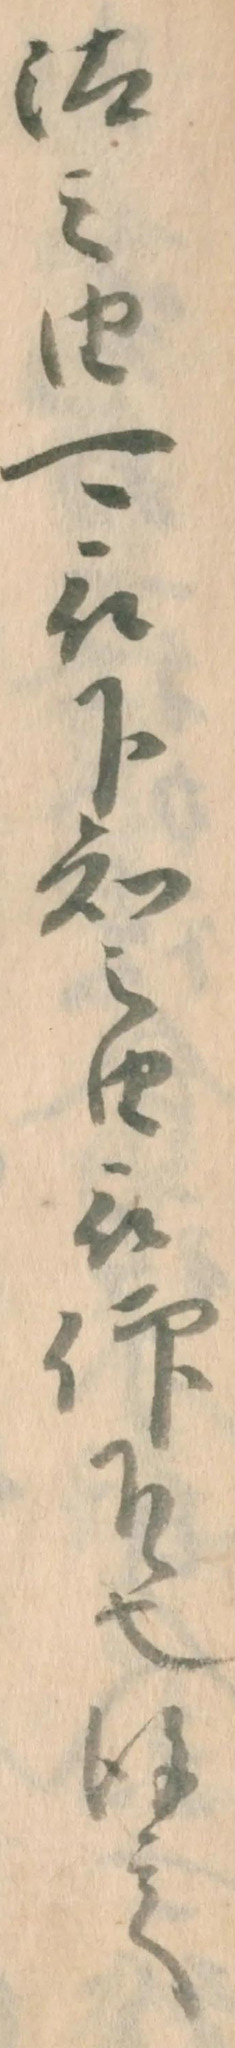汰之由可被下知之由被仰下候也謹言
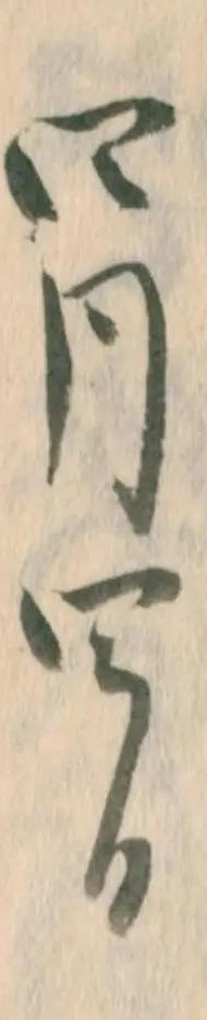四月七日
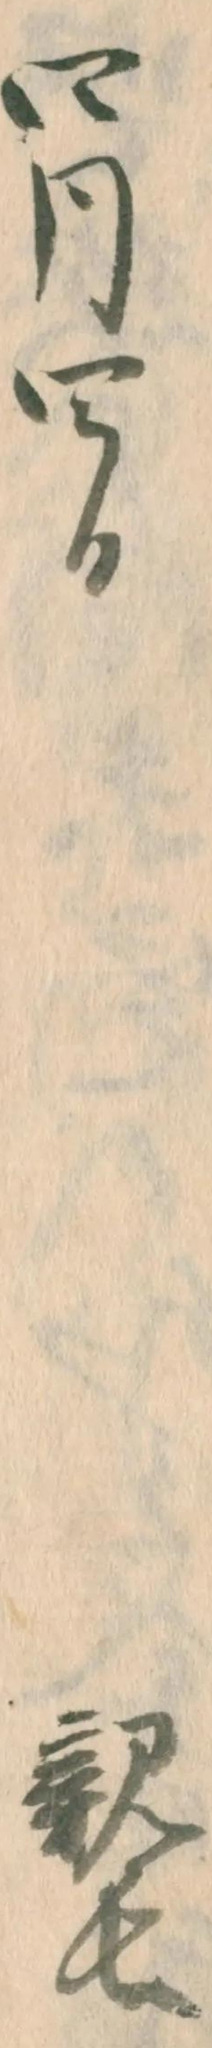四月四日親長
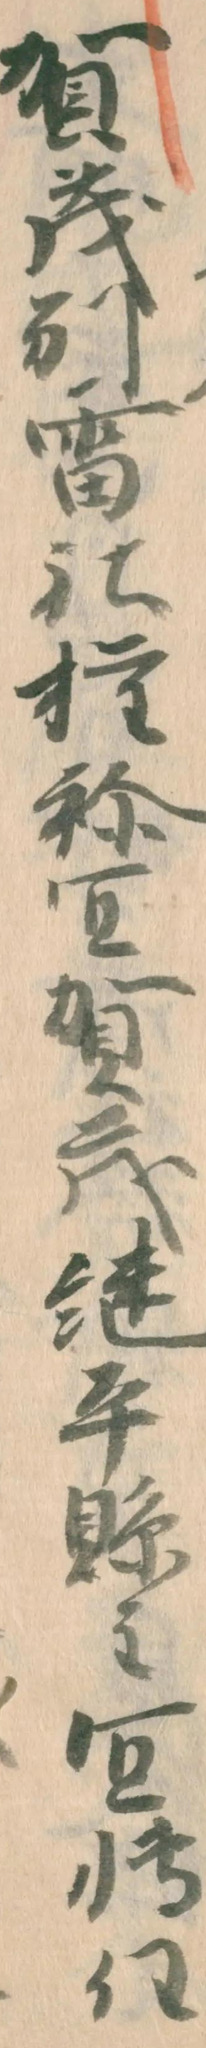賀茂別雷社權称宜賀茂継平県主宜転任
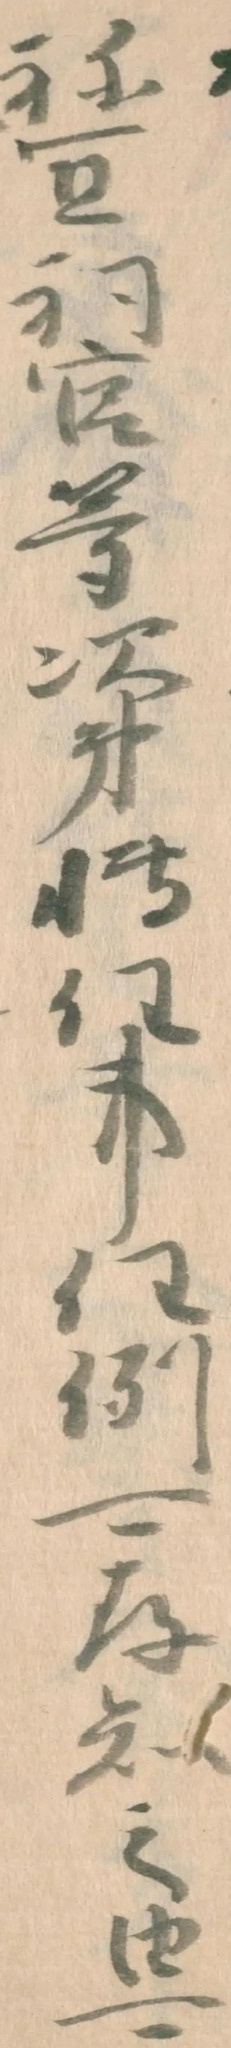祢宜祠官等次第転任事任例可存知之由可
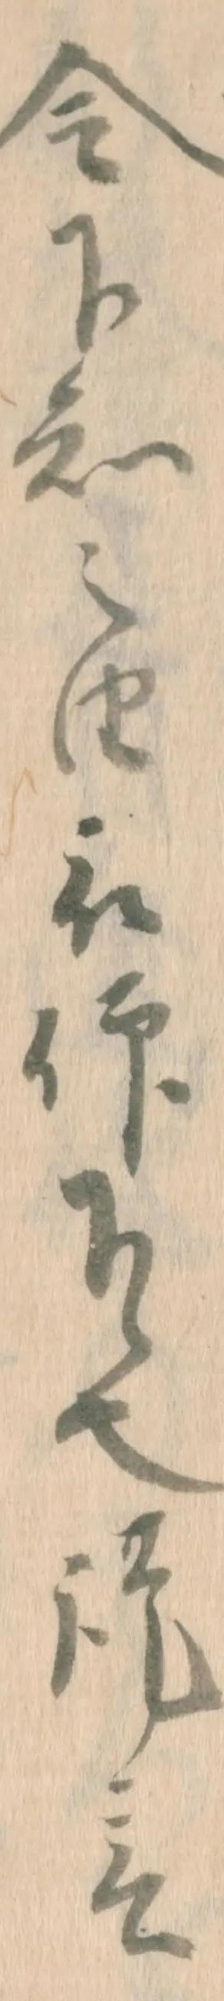令下知之由被仰下候也謹言
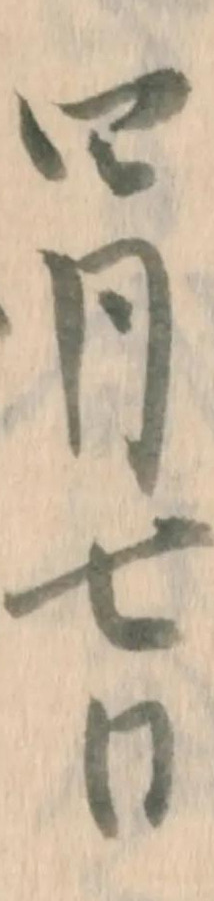四月七日
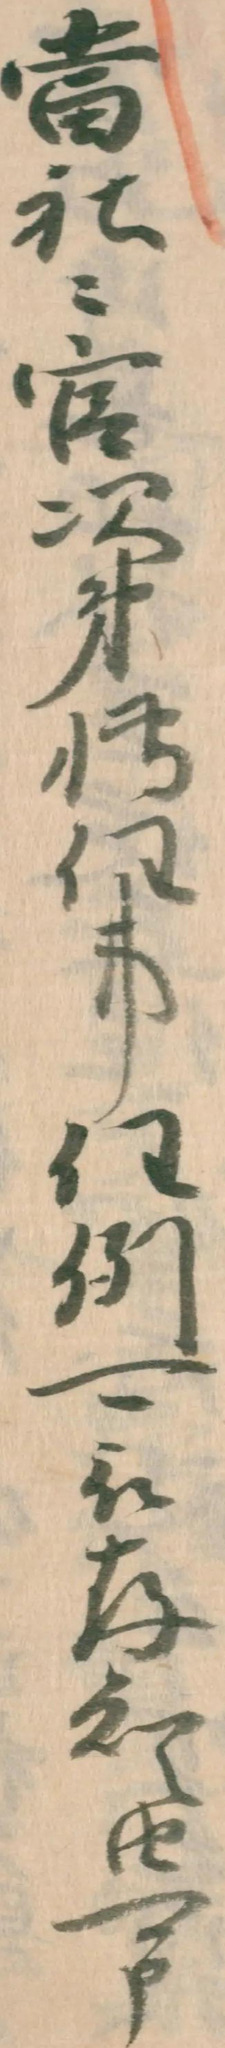当社々官次第転任事任例可被存知之由可申
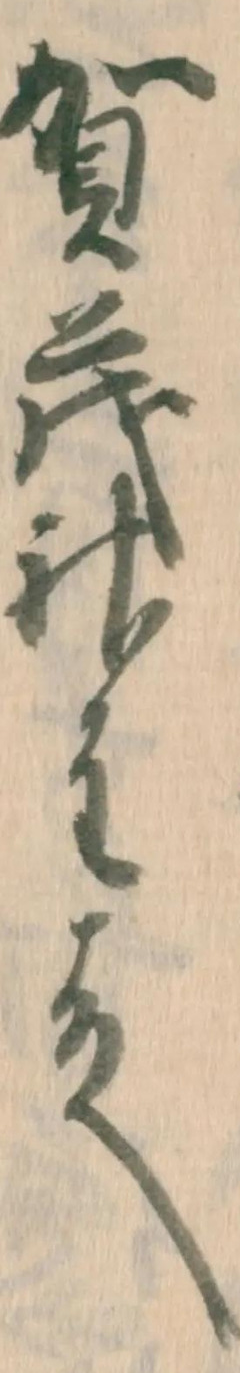賀茂神主殿
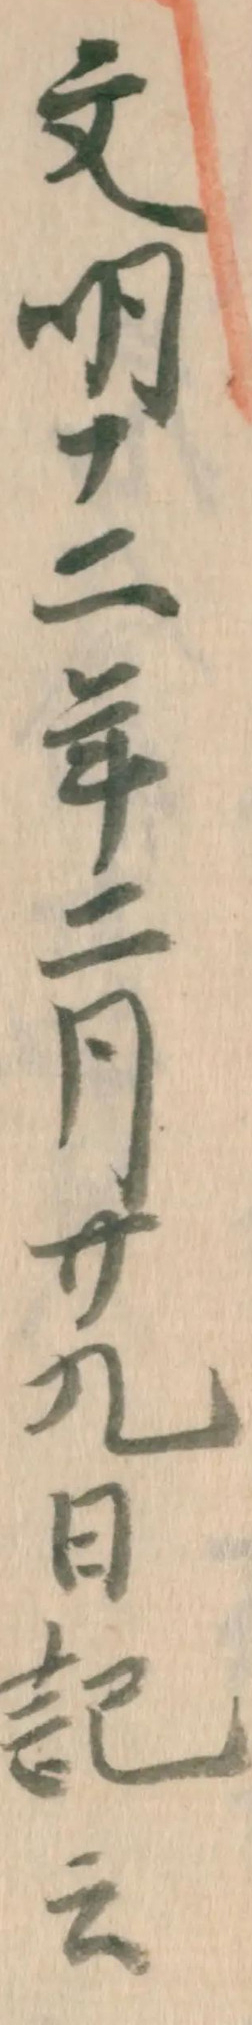文明十二年二月廿九日記云
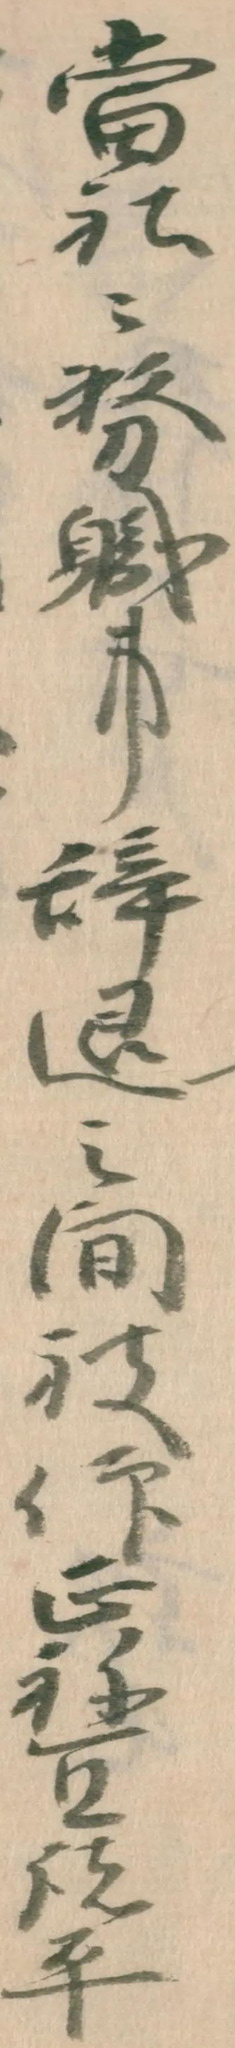当社々務職事辞退之間被仰正祢宜諸平
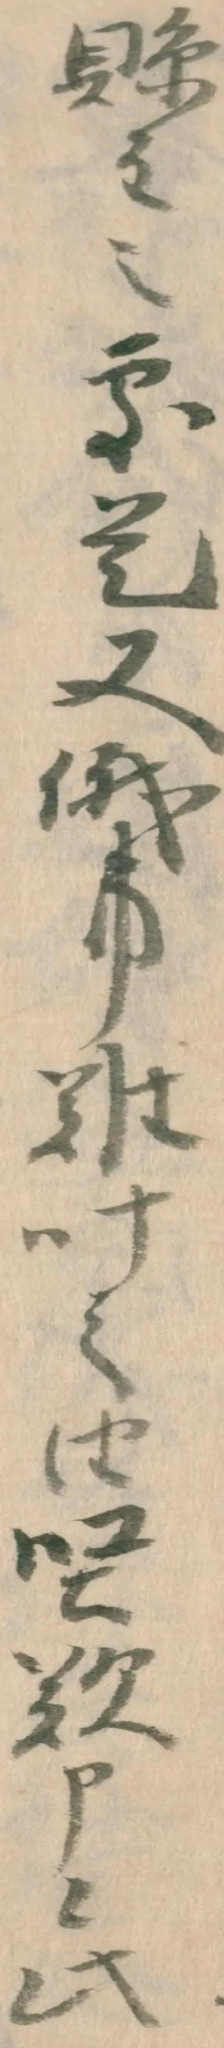県主之処是又俄事難叶之由堅歎申候此
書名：賀茂社記録. 第1冊
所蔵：国立国会図書館 National Diet Library, JAPAN
